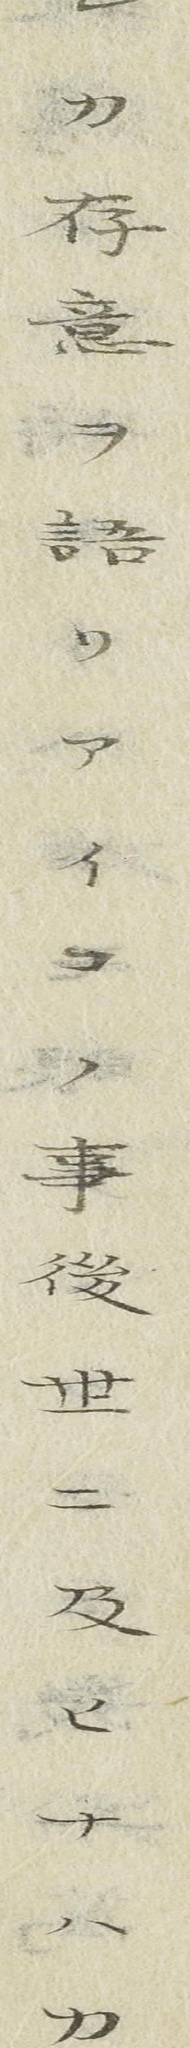レカ存意ヲ語リアイコノ事後世ニ及ヒナハカ
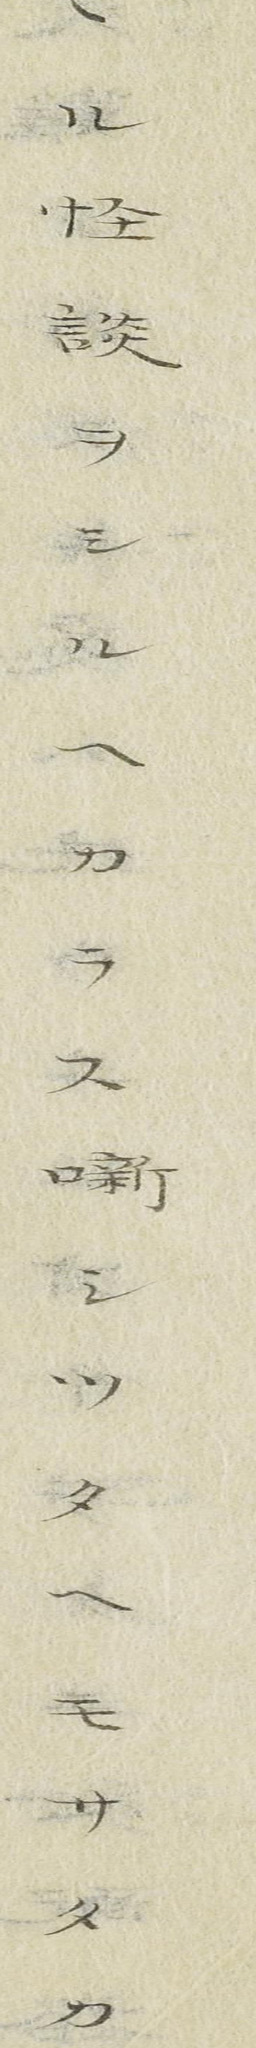ヽル怪談ヲシルヘカラス噺シツタヘモサタカ
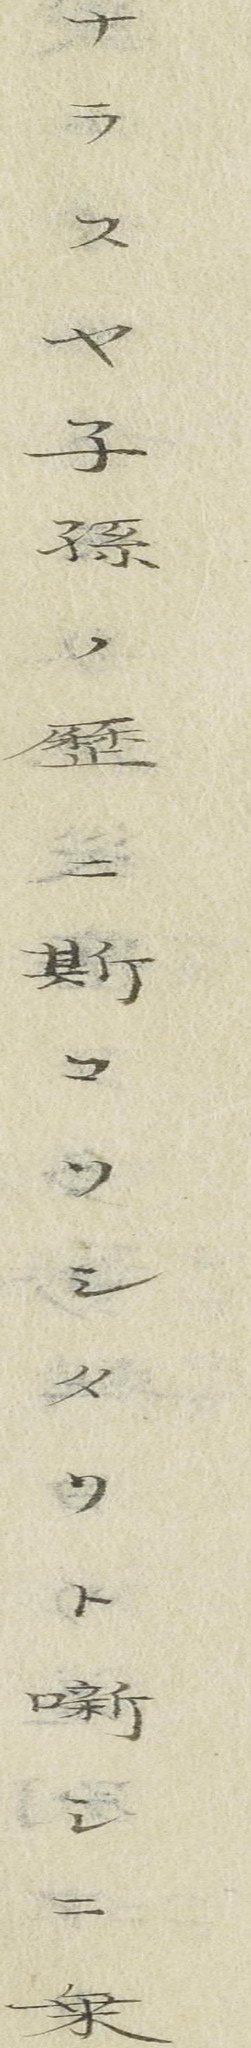ナラスヤ子孫ノ歴ニ斯コソシタリト噺シニ乗
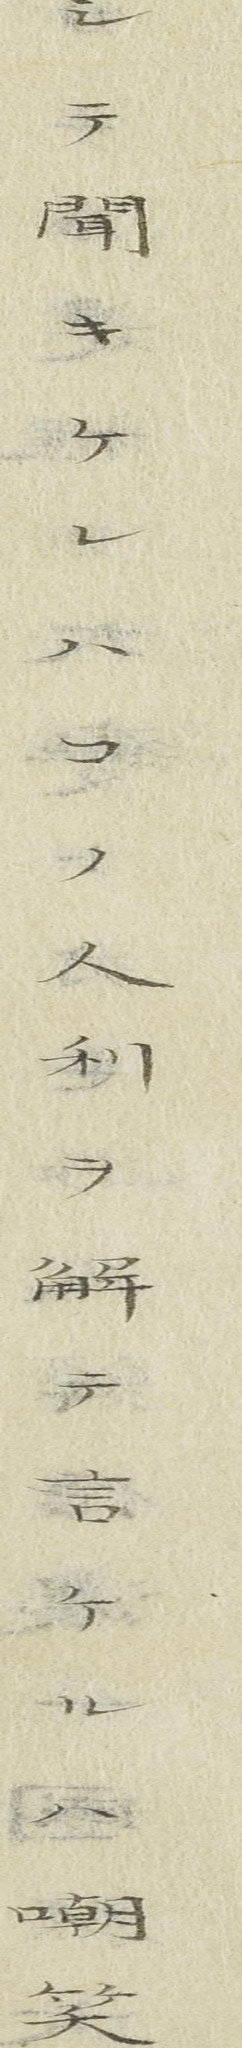シテ聞キケレハコノ人利ヲ解テ言ケルハ嘲笑
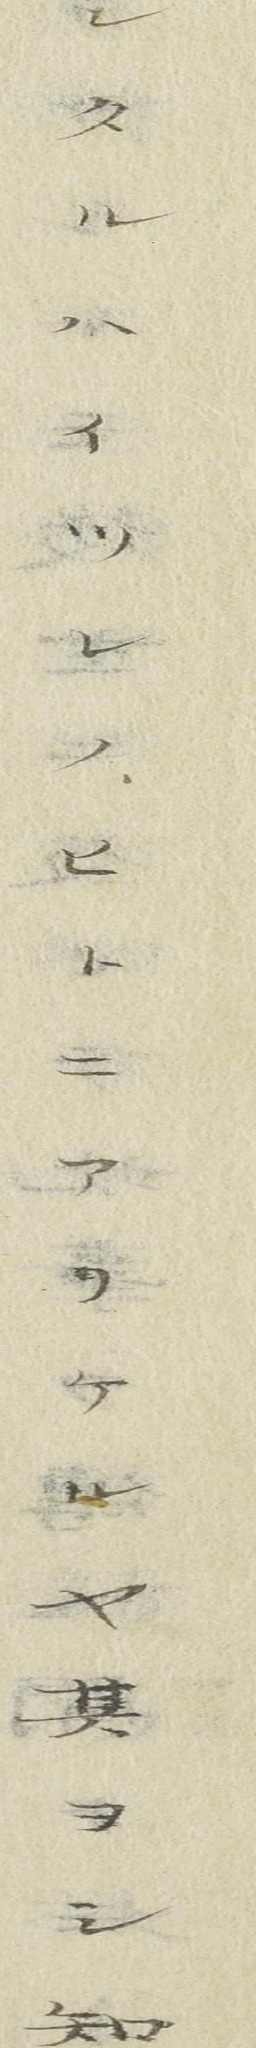シタルハイツレノヒトニアリケルヤ其ヲシ知

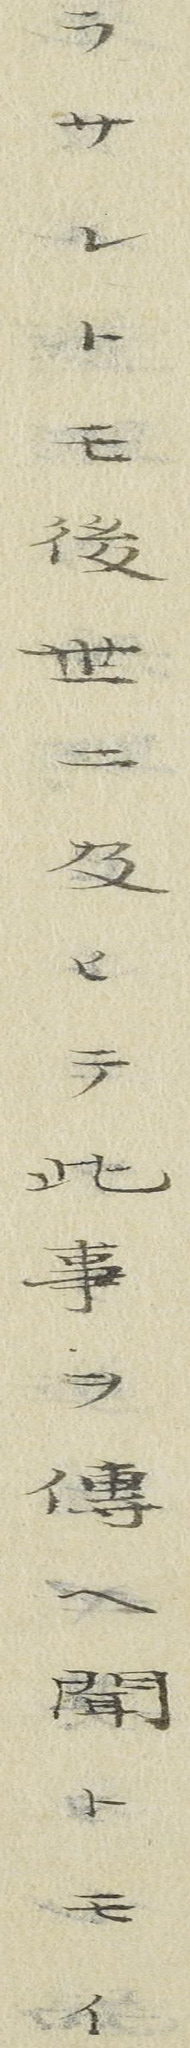ラサレトモ後世ニ及ヒテ此事ヲ傳ヘ聞トモイ
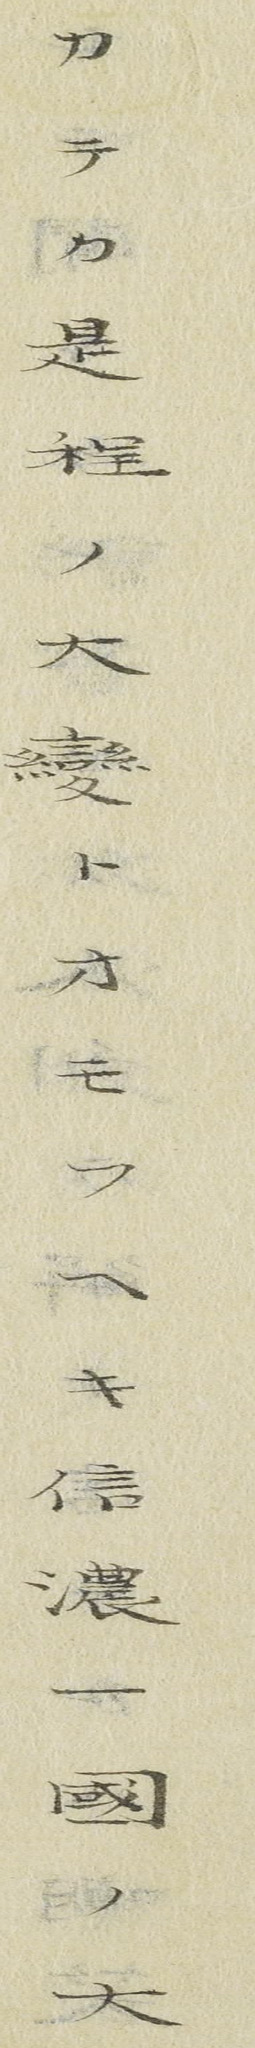カテカ是程ノ大變トオモフヘキ信濃一國ノ大
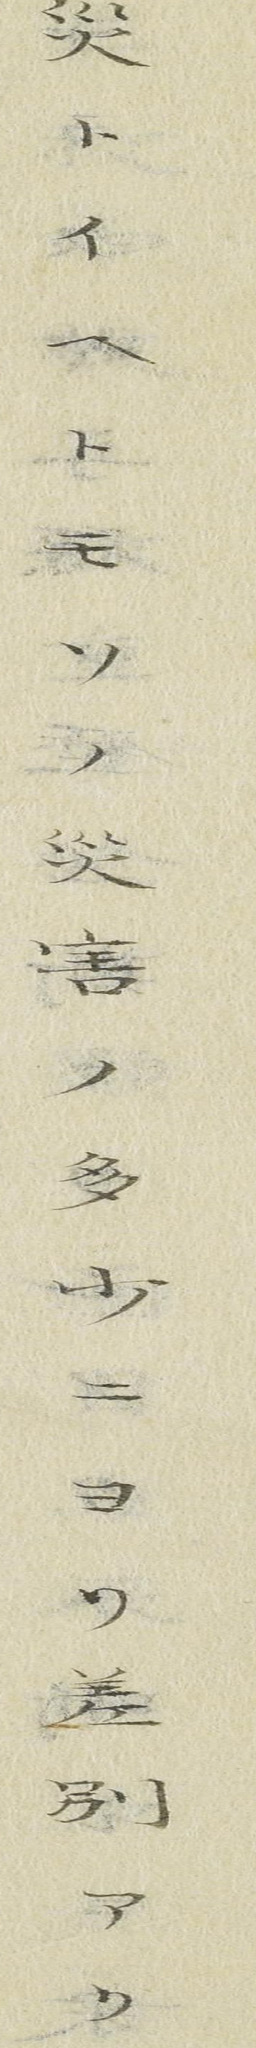災トイヘトモソノ災害ノ多少ニヨリ差別アリ
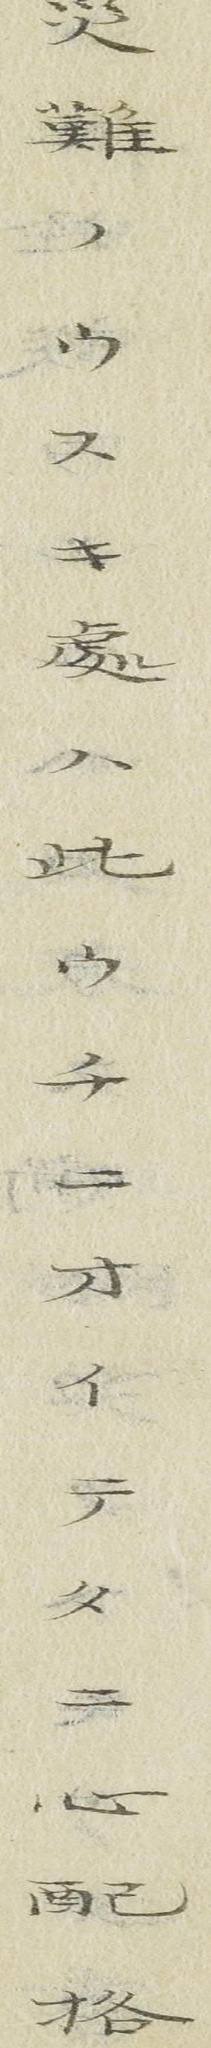災難ノウスキ處ハ㗅此ウチニオイテタニ心配格
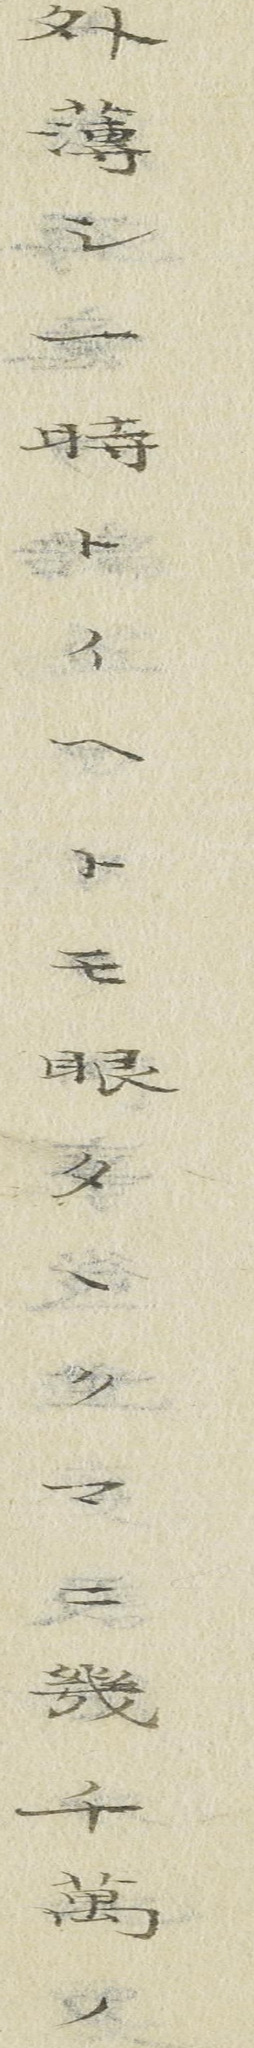外薄シ一時トイヘトモ眼タゝクマニ幾千萬ノ
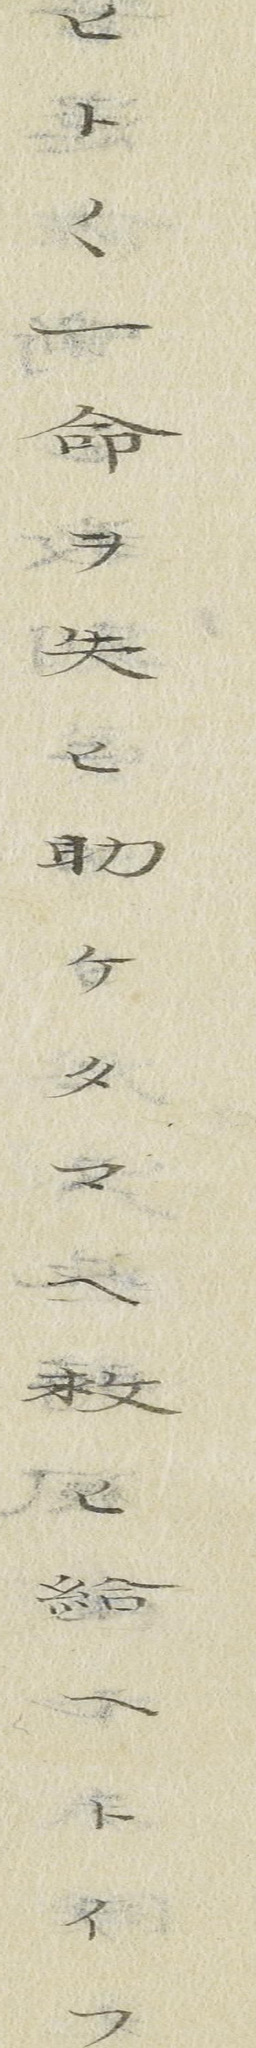ヒト〳〵一命ヲ失ヒ助ケタマヘ救ヒ給ヘトイフ
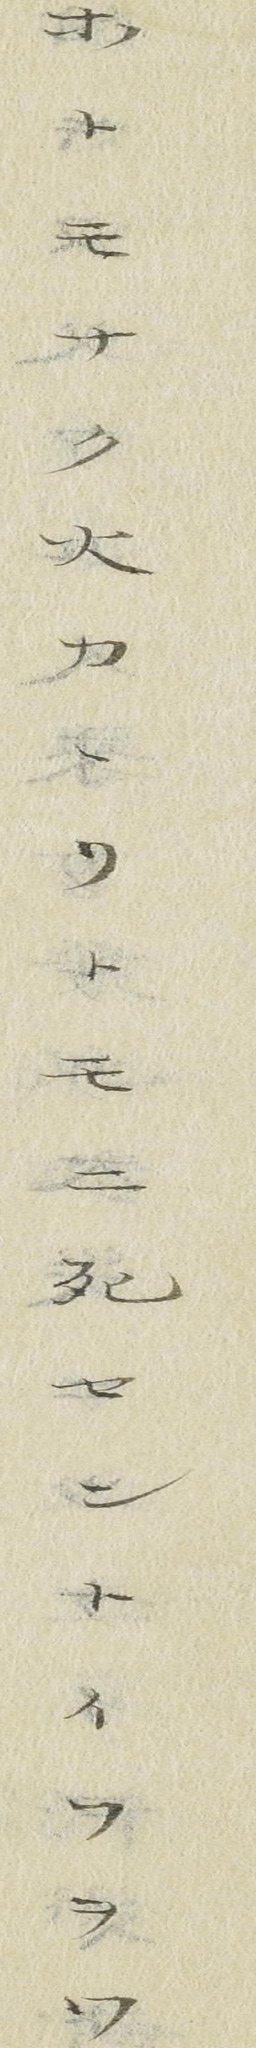ホトモナク火カゝリトモニ死セントイフヲワ
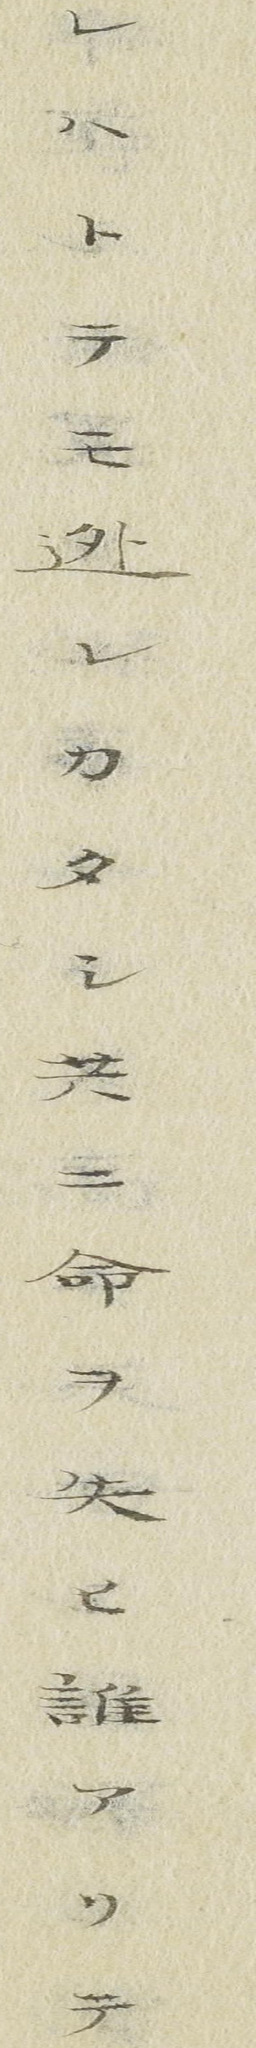レハトテモ迯レカタシ共ニ命ヲ失ヒ誰アリテ
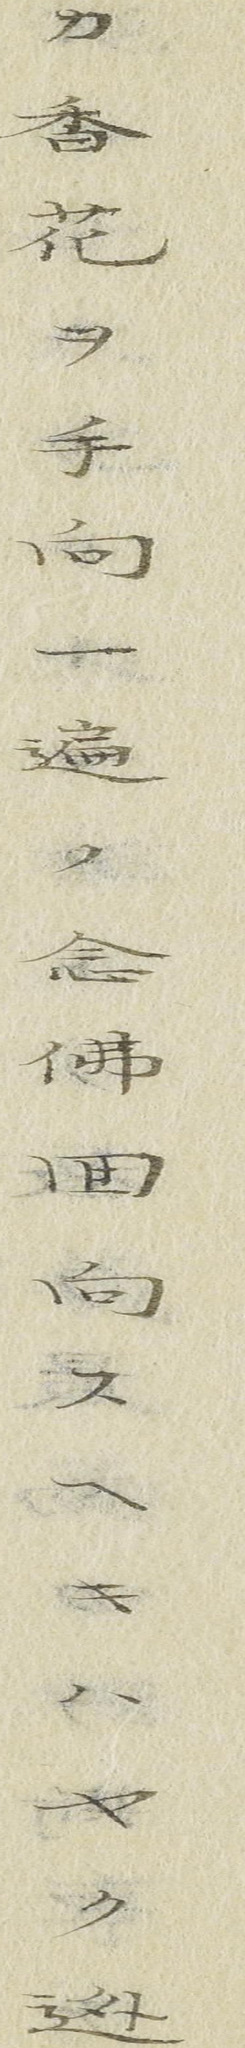カ香花ヲ手向一遍ノ念佛回向スヘキハヤク迯
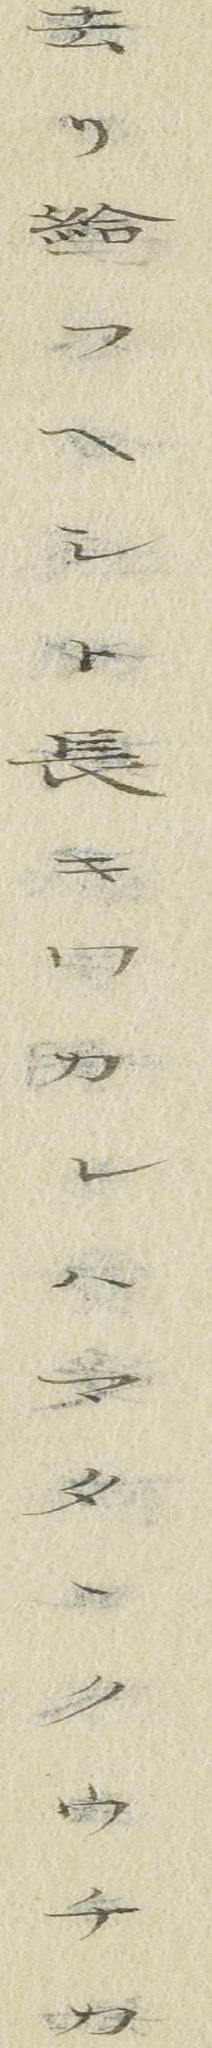去リ給フヘシト長キワカレハマタゝクウチカ
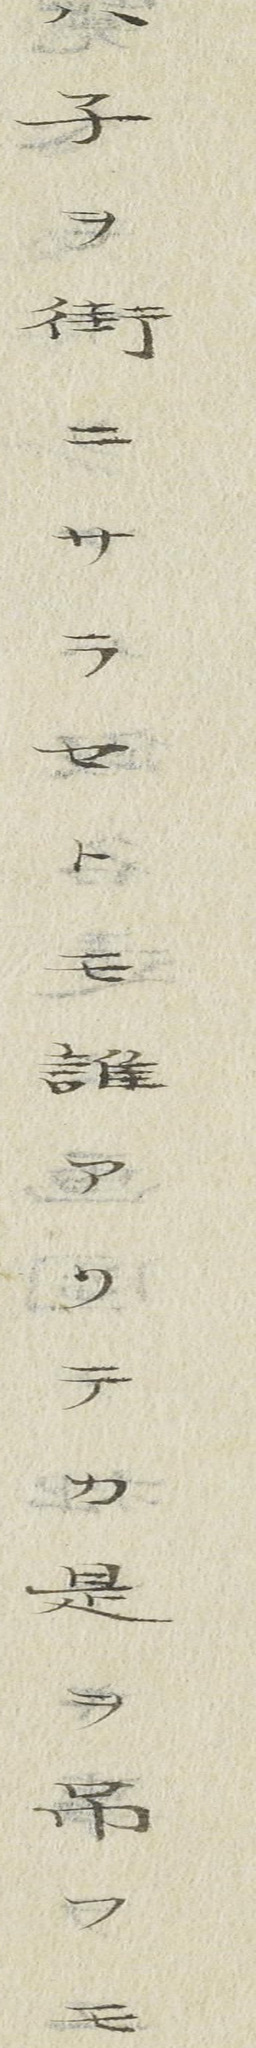ハ子ヲ街ニサラセトモ誰アリテカ是ヲ吊フモ
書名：地災撮要　地震之部　巻ノ二
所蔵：東京大学地震研究所図書室 Earthquake Research Institute Library, The University of Tokyo, JAPAN
